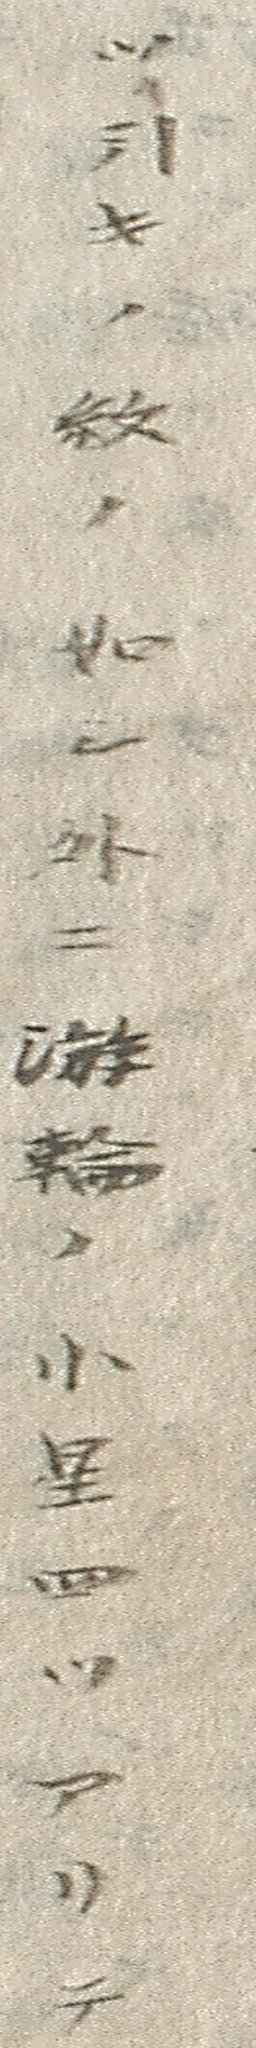ツ引キノ紋ノ如シ外ニ游輪ノ小星四ツアリテ
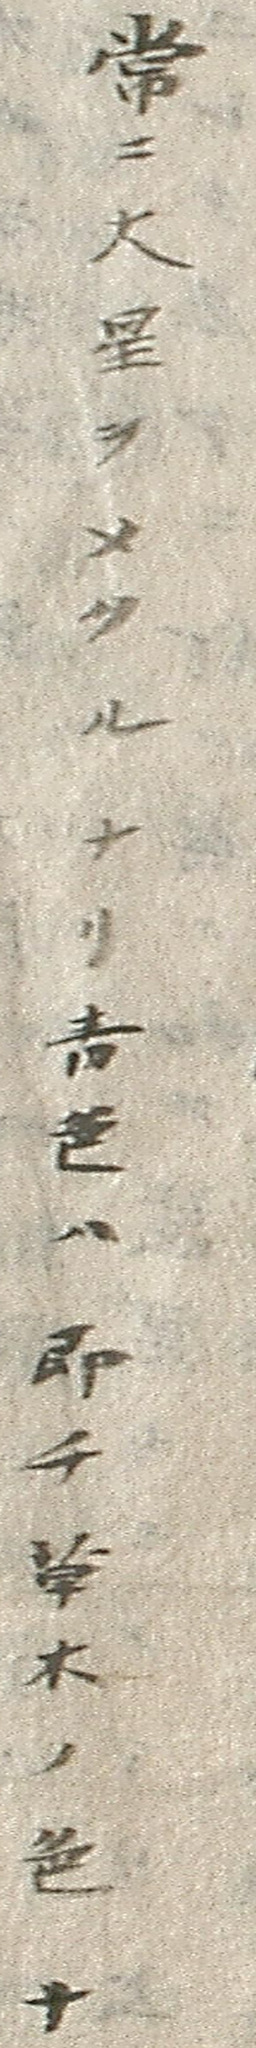常ニ大星ヲメクルナリ青色ハ即チ草木ノ色ナ
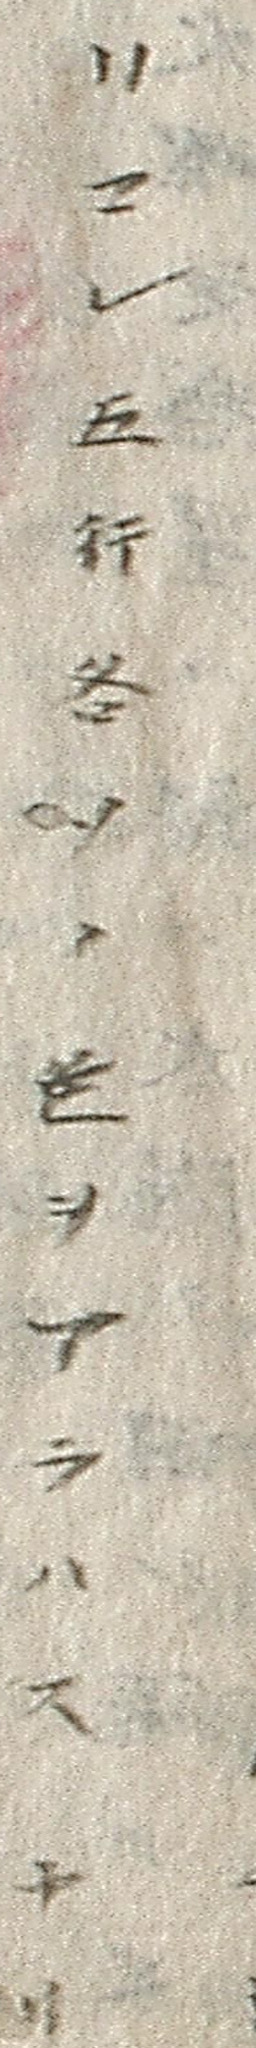リコレ五行各ソノ色ヲアラハスナリ
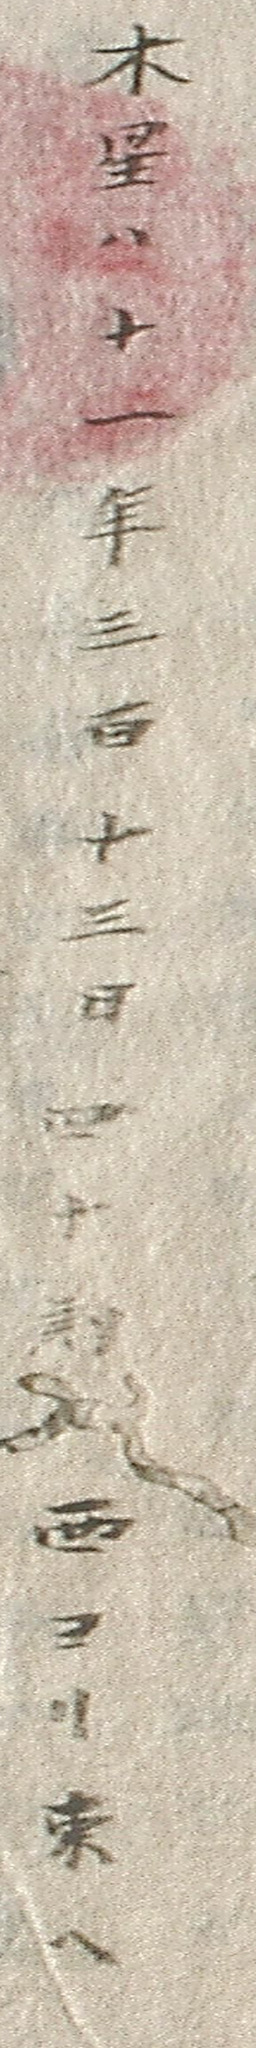木星ハ十一年三百十三日四十刻ニ西ヨリ東ヘ
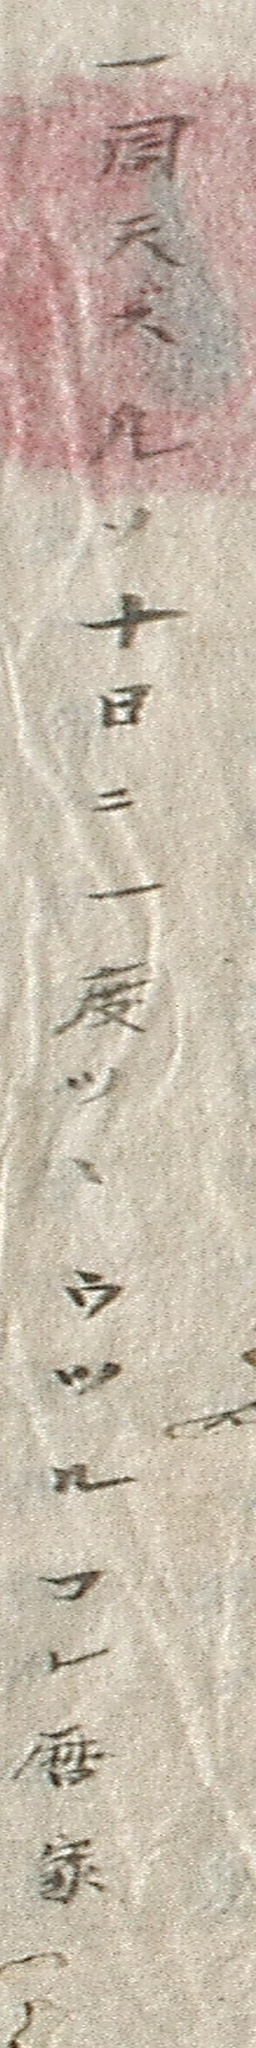一周天ス凡ソ十日ニ一度ツヽウツルコレ暦家
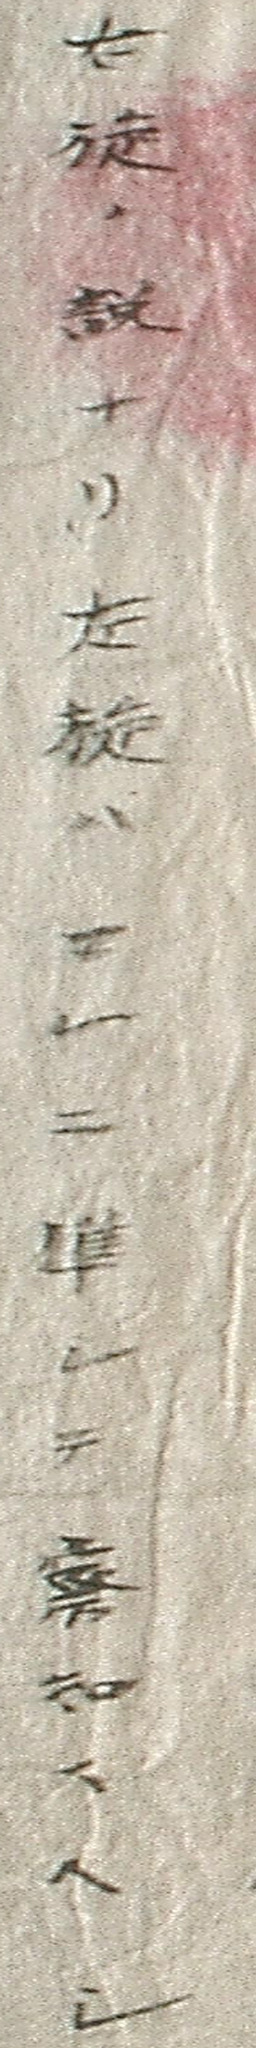右旋ノ説ナリ左旋ハコレニ準シテ察知スヘシ

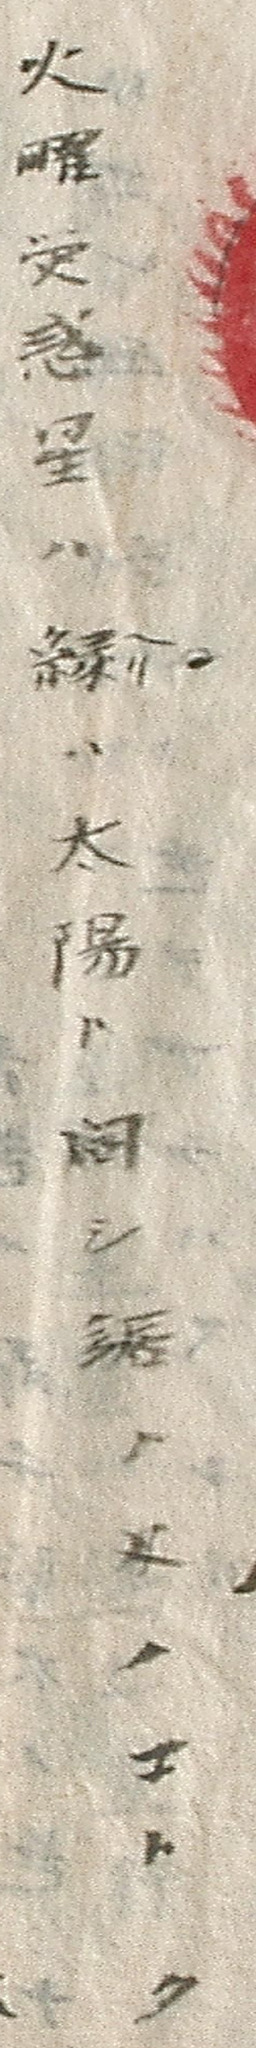火曜熒惑星ハ縁ハ太陽ト同シ鋸の刃ノコトク
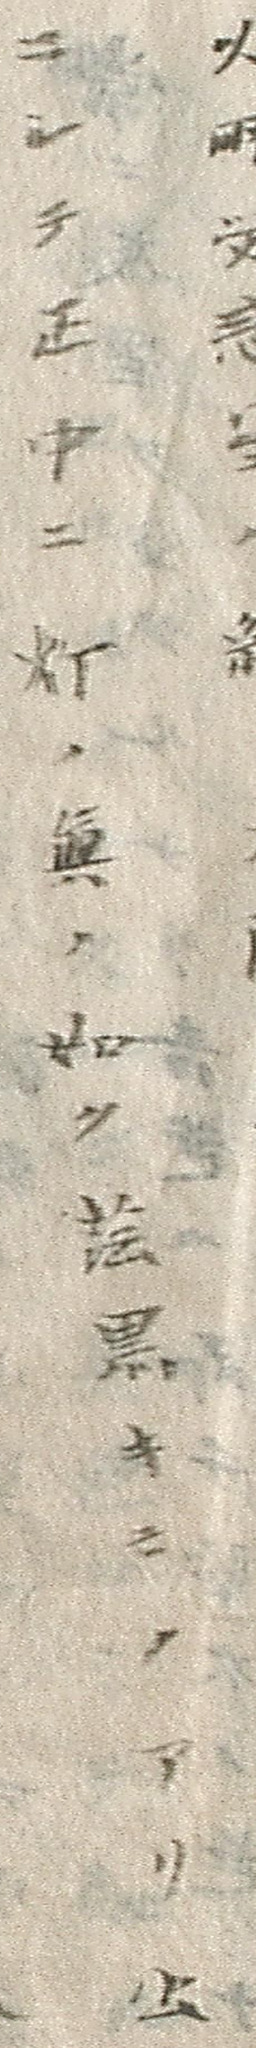ニシテ正中ニ灯ノ眞ノ如ク薄黒キモノアリ出
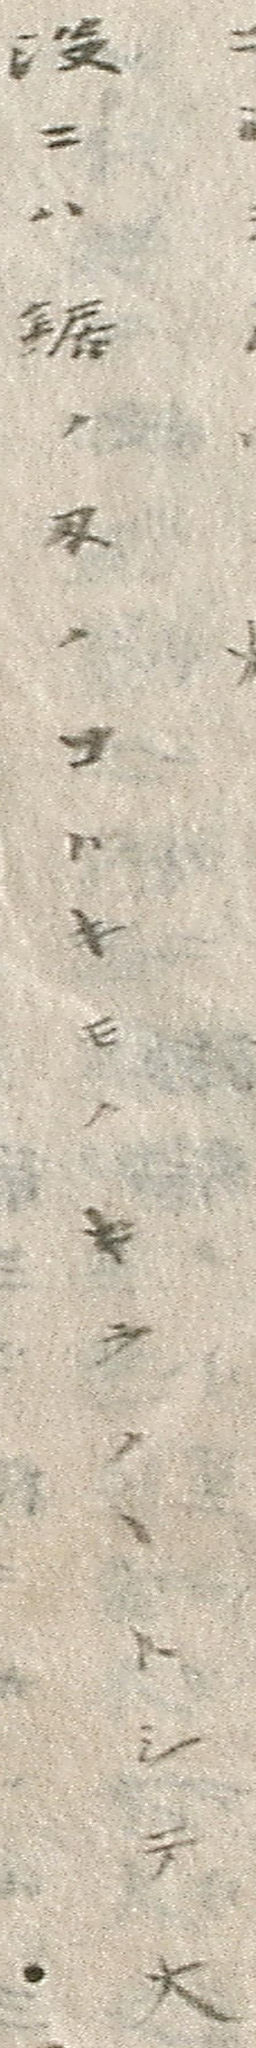没ニハ鋸ノ刃ノコトキモノキラ〳〵トシテ大
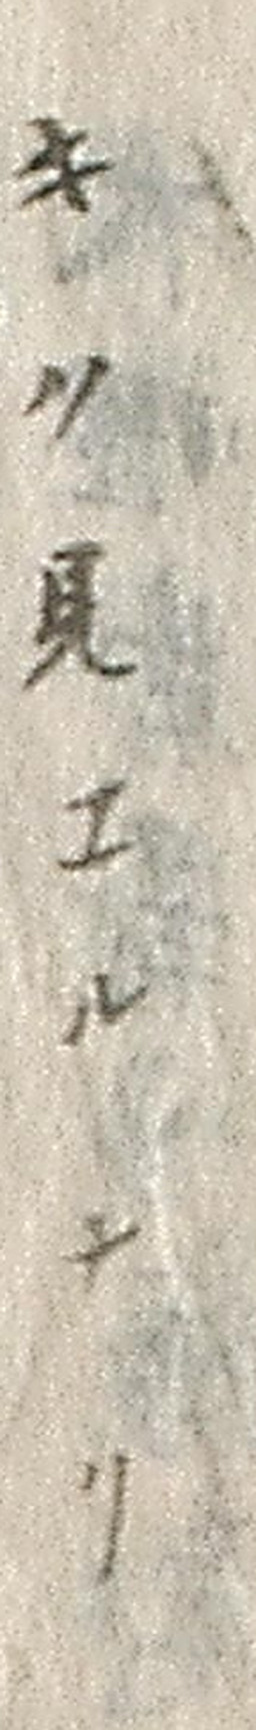キク見ユルナリ
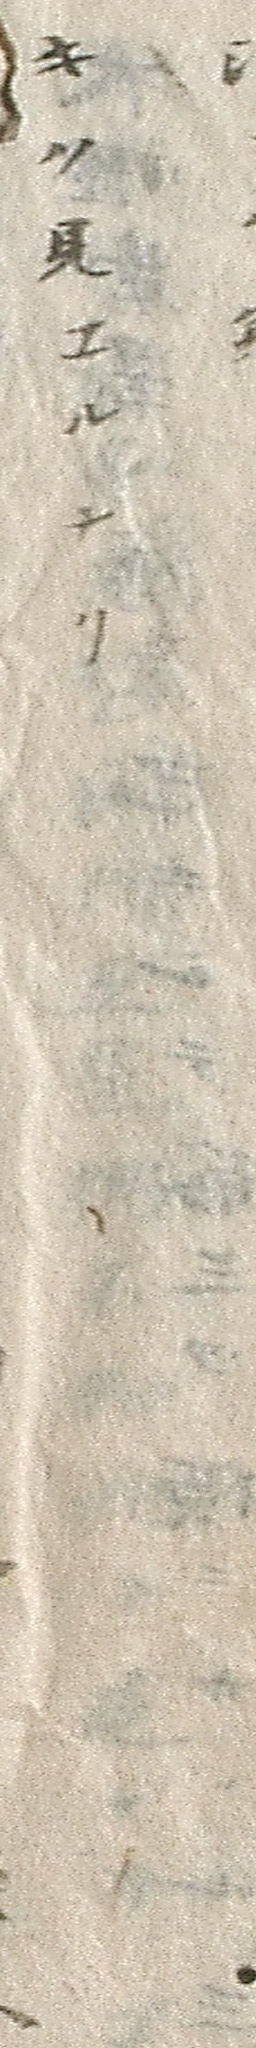キク見ユルナリ
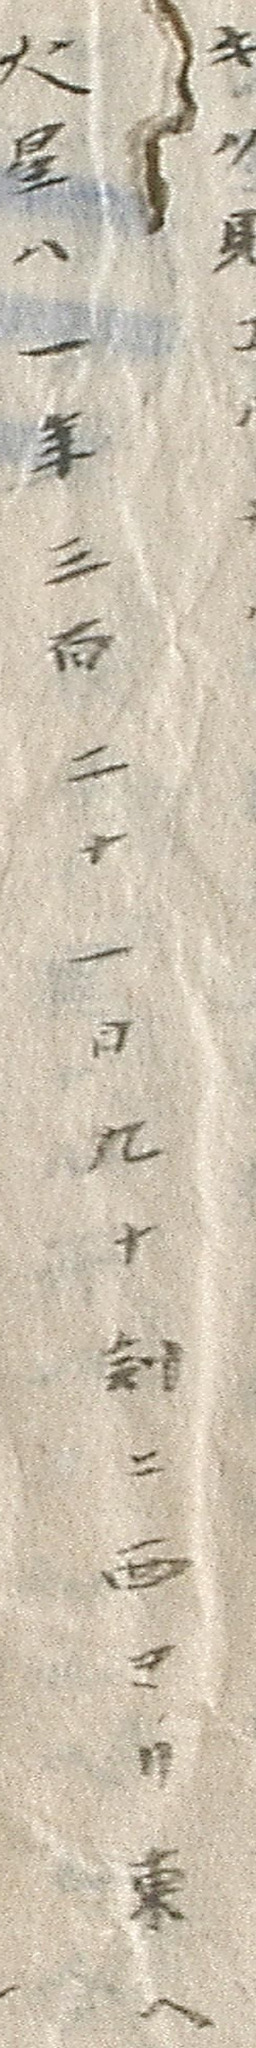火星ハ一年三百二十一日九十刻ニ西ヨリ東ヘ
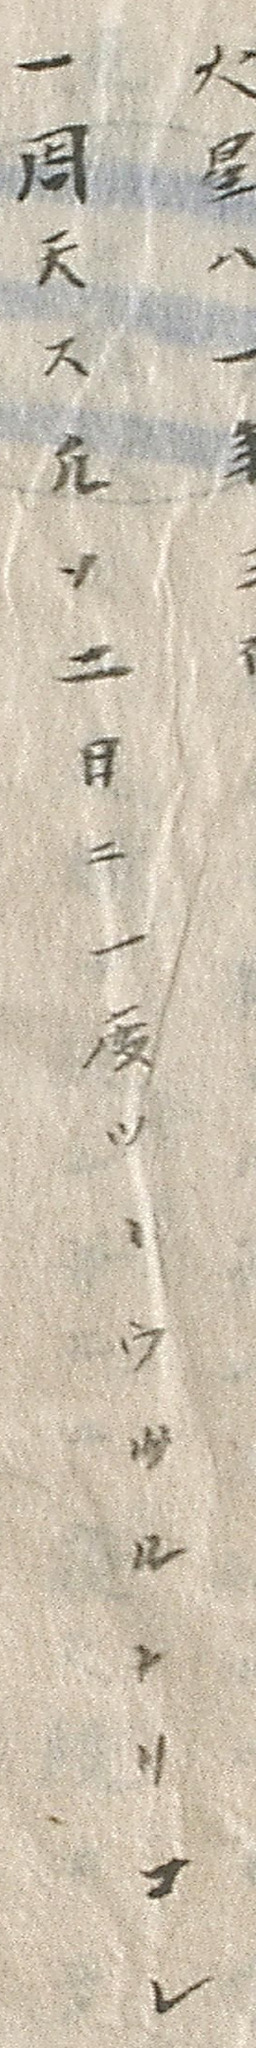一周天ス凡ソニ日ニ一度ツヽウツルナリコレ
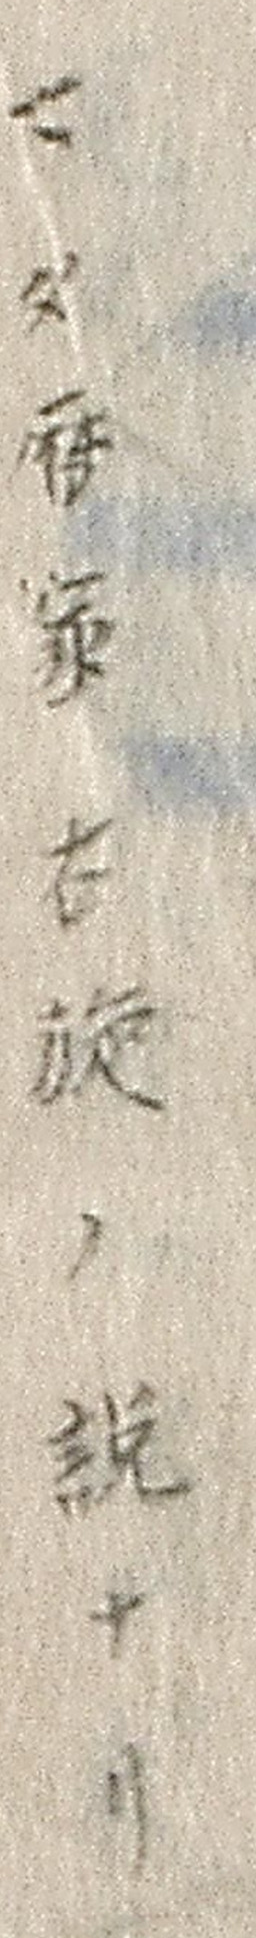マタ暦家右旋ノ説ナリ
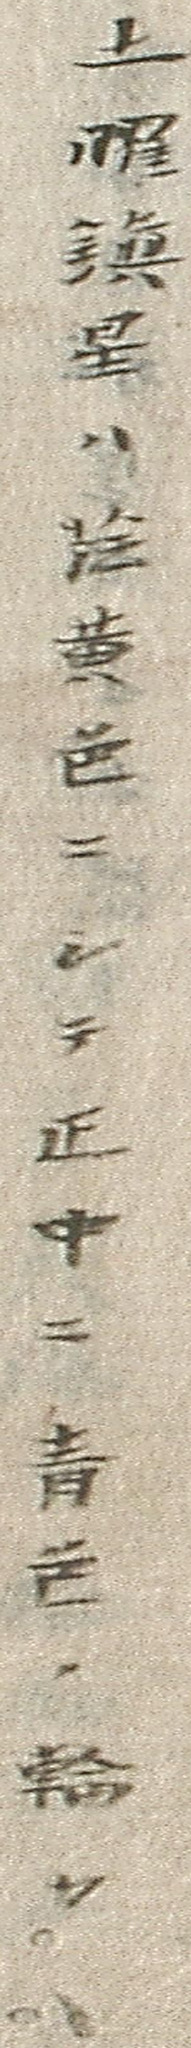土曜鎮星ハ薄黄色ニシテ正中ニ青色ノ輪カヽ
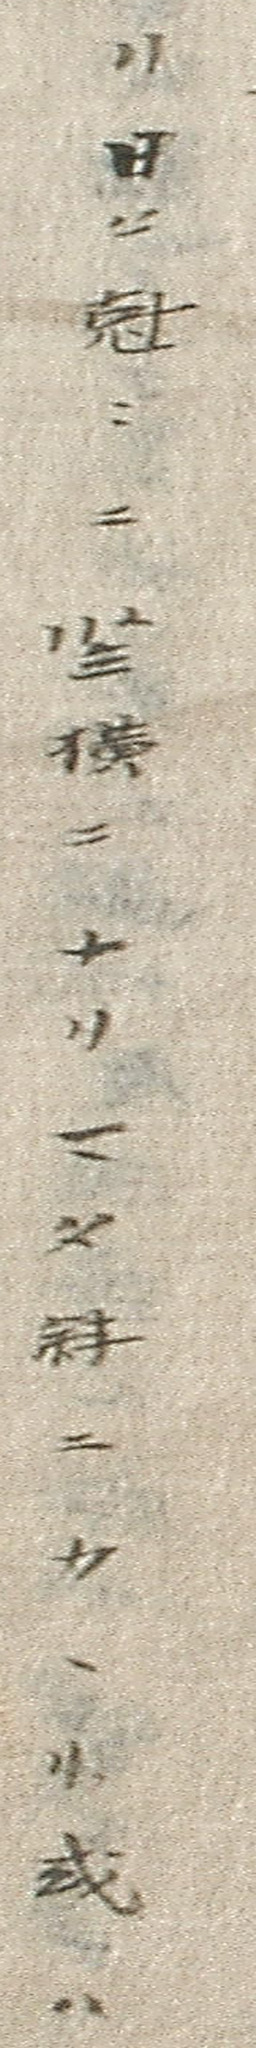リ日々尅々ニ竪横ニナリマタ斜ニカヽリ或ハ
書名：天學便蒙図説
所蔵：東京大学地震研究所図書室 Earthquake Research Institute Library, The University of Tokyo, JAPAN
